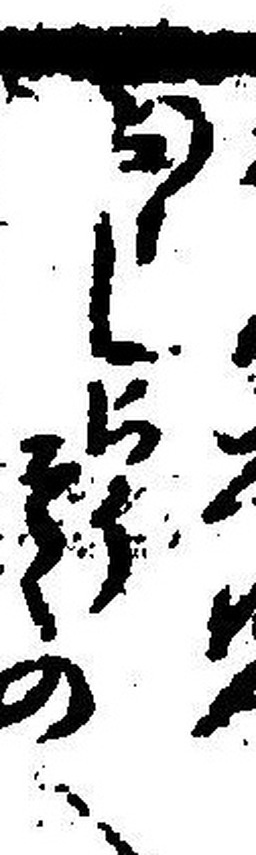おゝしらう
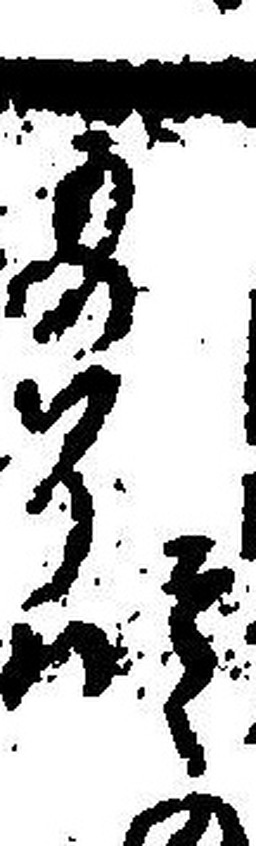ものいりは
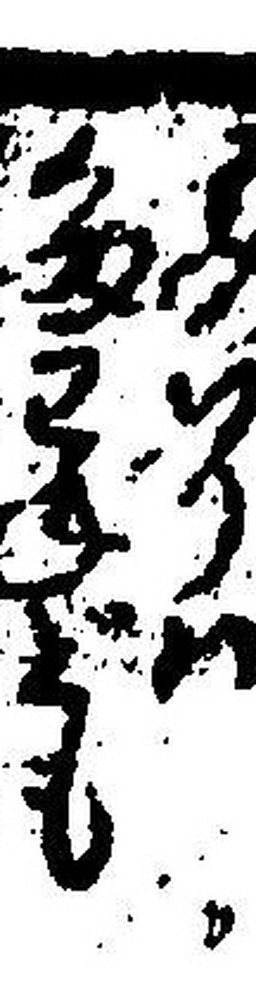かまわねども
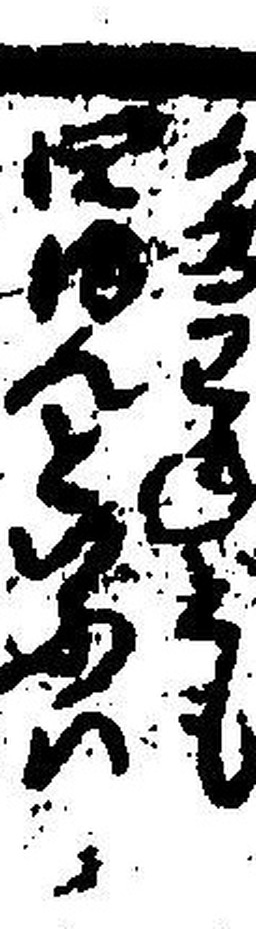四ほんといふは
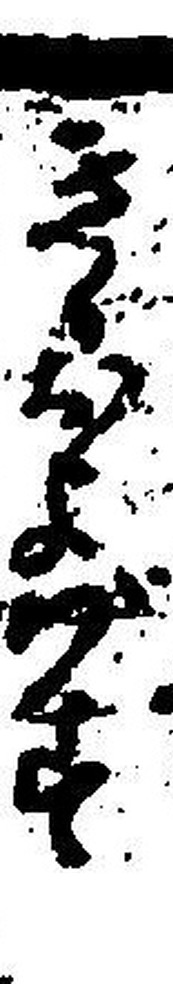きゝおよばす
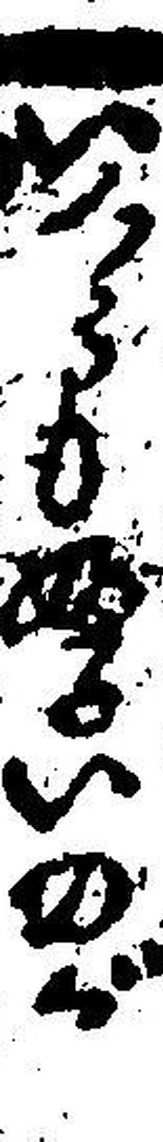いくらもふるいのが
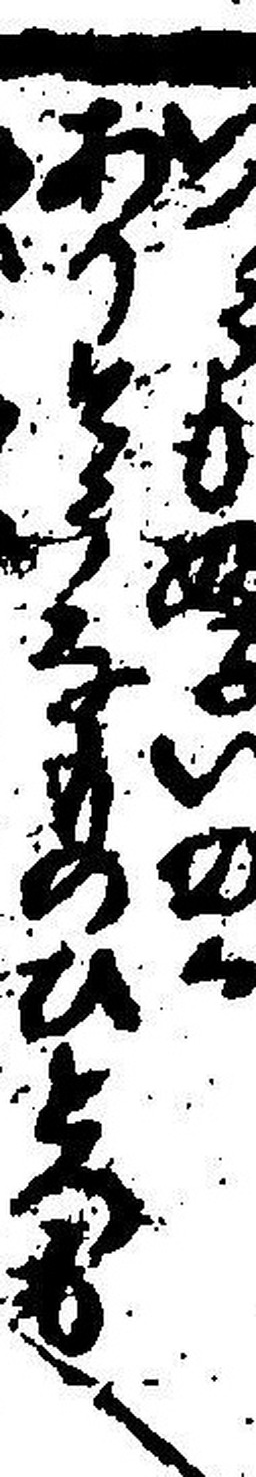ありそうなものひとつも
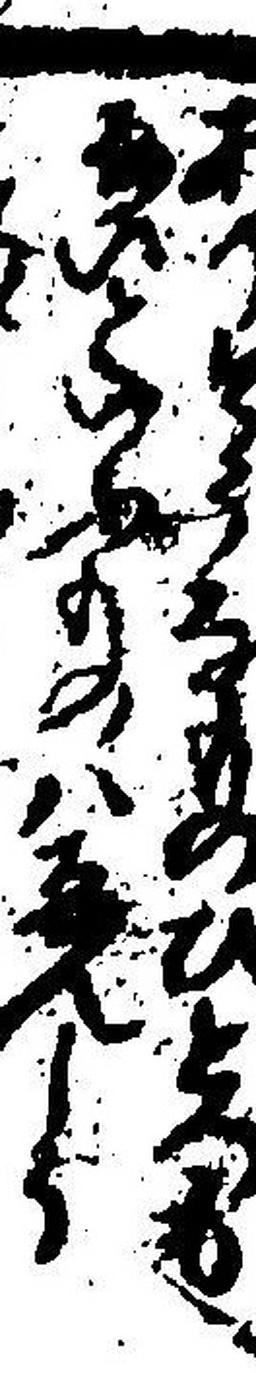ないといふものはゑんしう
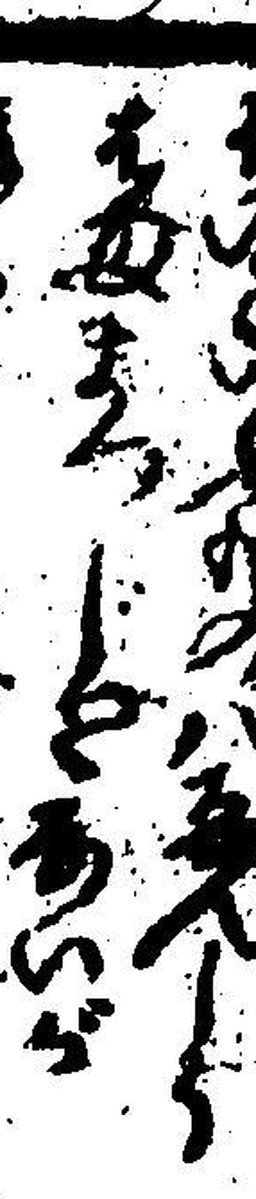はままつじやないが
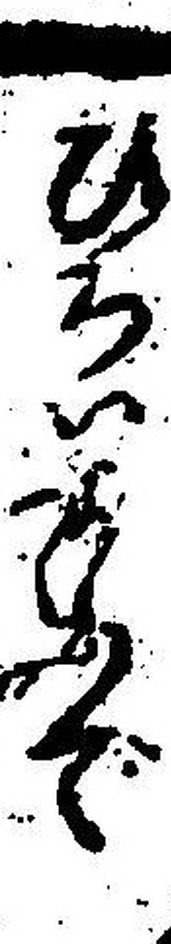ひろいよふで
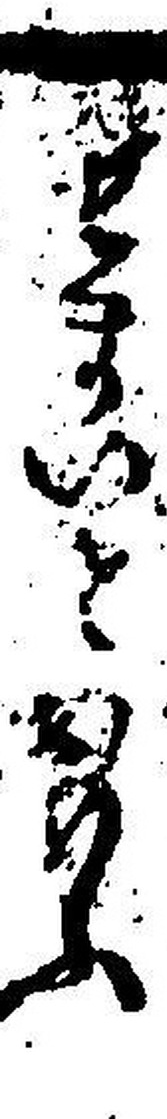せまいとおもふ

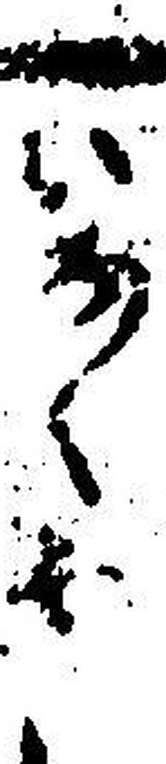いろ〳〵
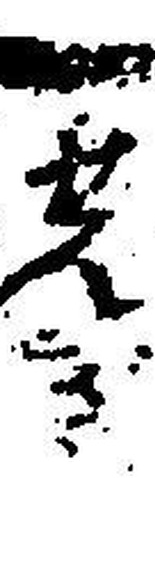せんぎ
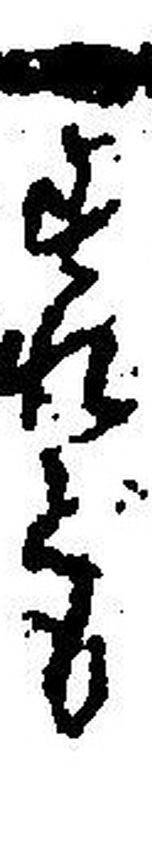すれども
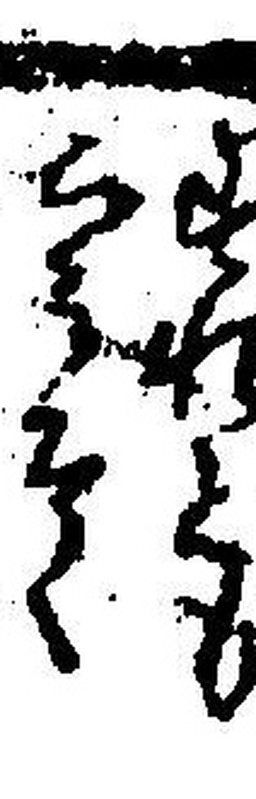ろうそく
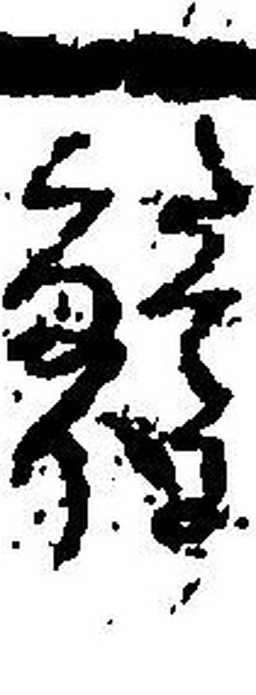こまり
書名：御代参牛時詣 / 市場通笑作
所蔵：東京大学総合図書館 General Library in the University of Tokyo, JAPAN
